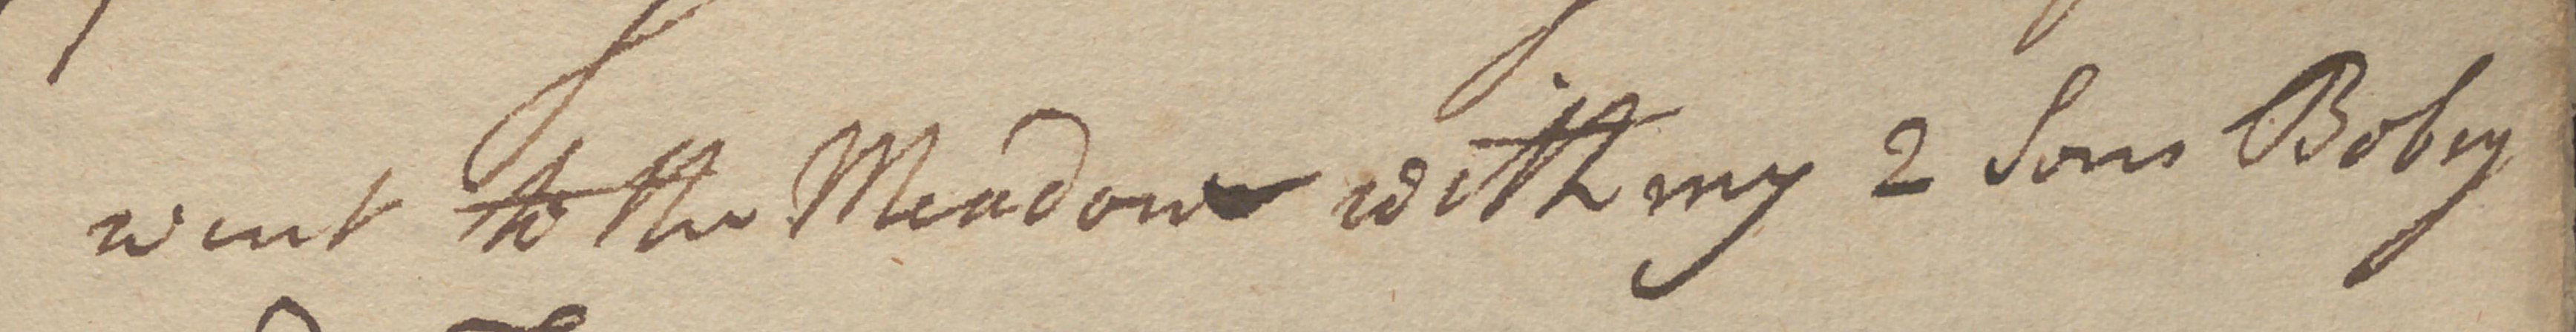went to the Meadow with my 2 Sons Bobey
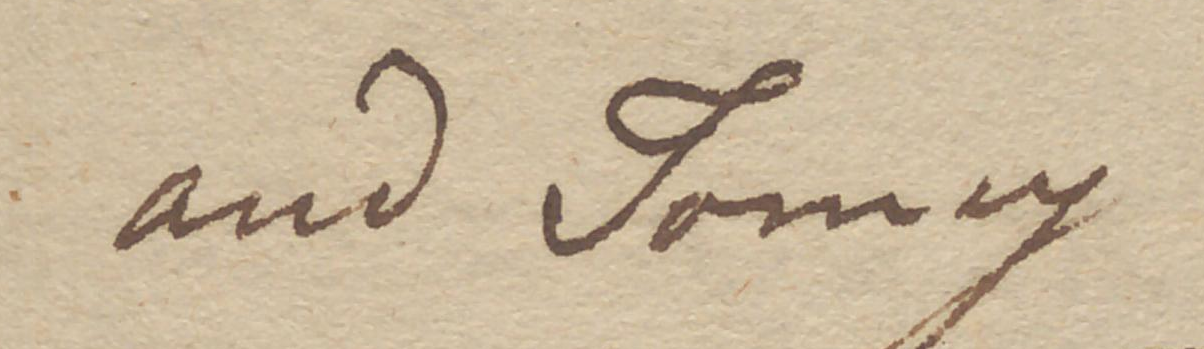and Tomey
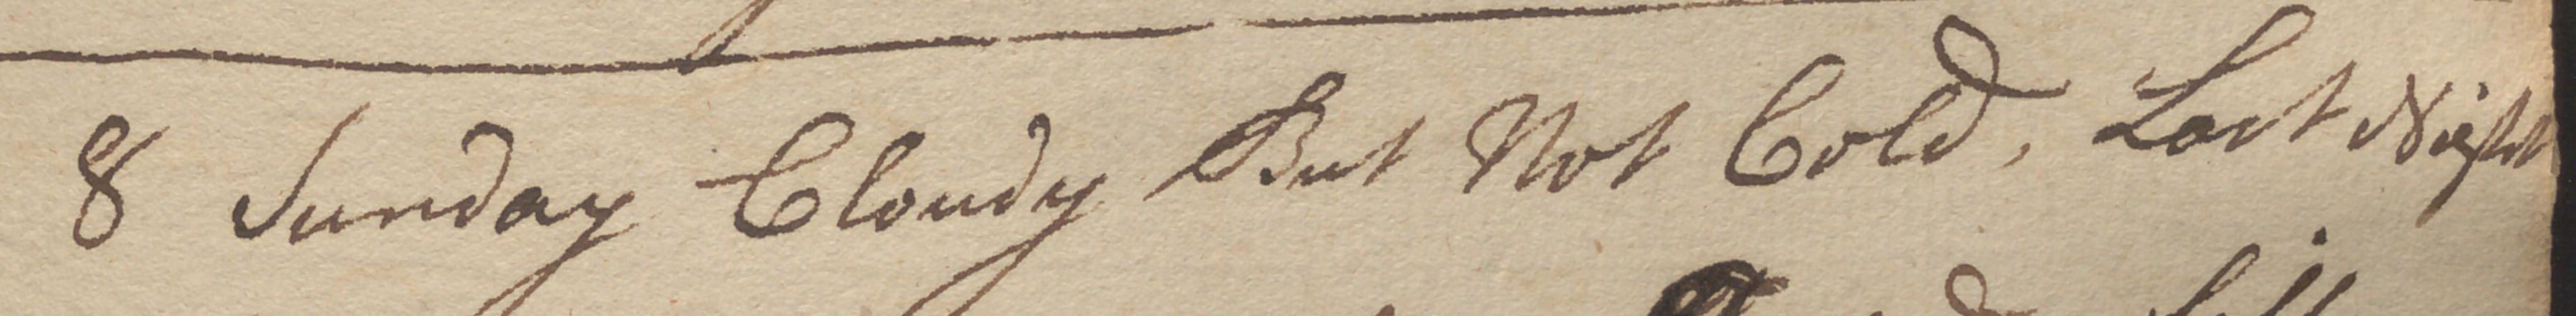8 Sunday Cloudy But Not Cold, Last Night
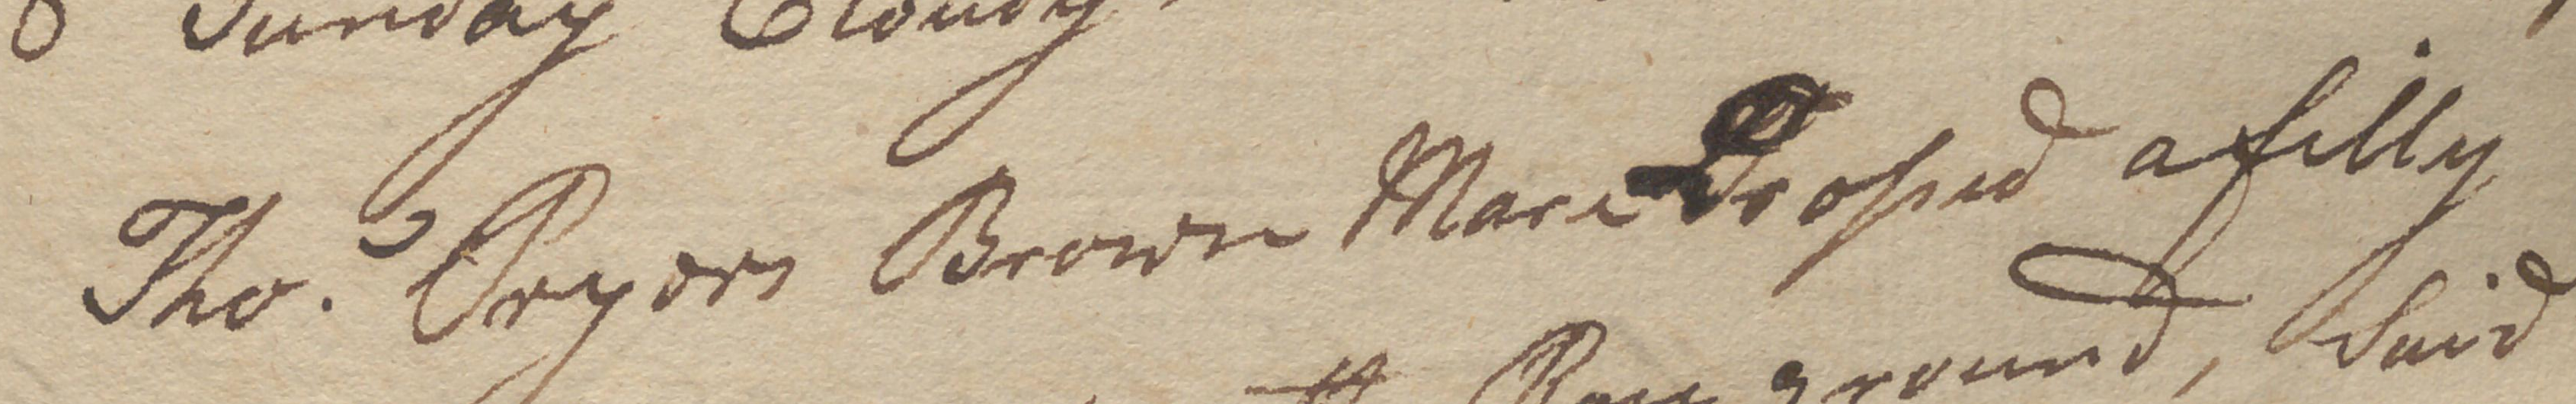Tho^s. Pryors Brown Mare Droped a filly
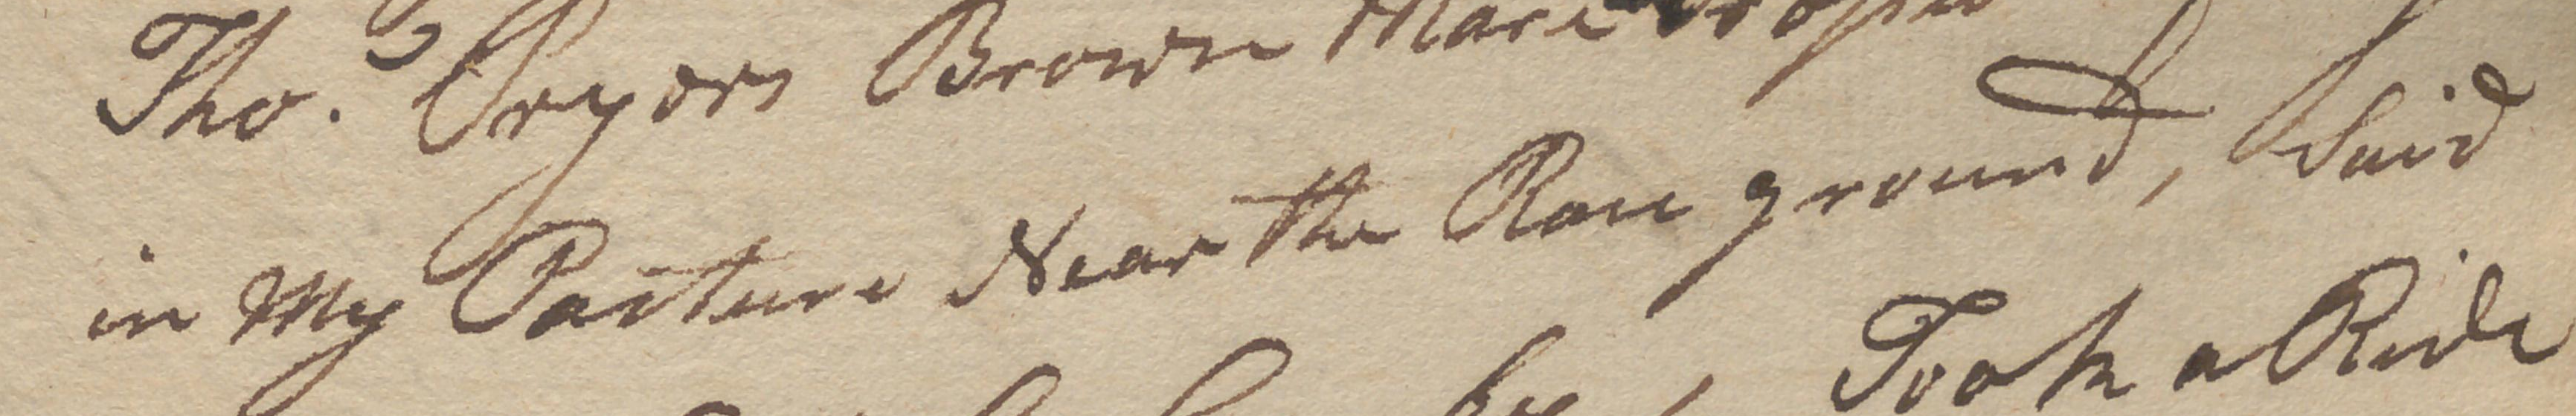in My Pasture Near the Race ground, Said
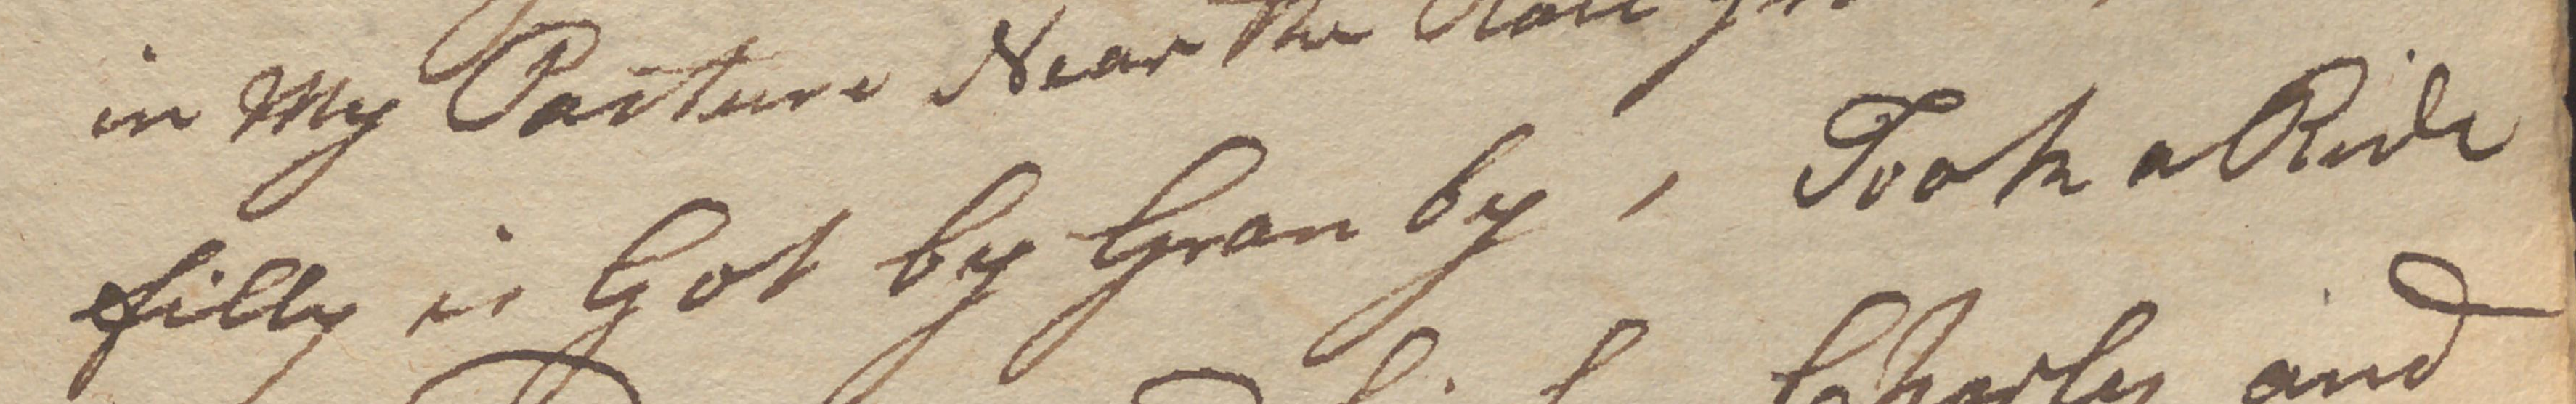filly is Got by Granby, Took a Ride
